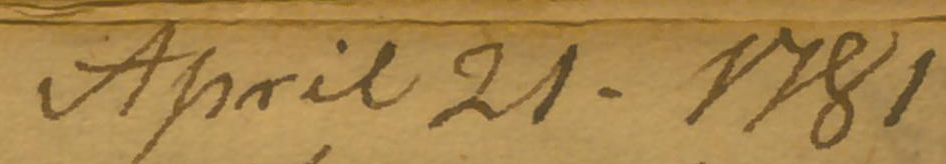April 21. 1781
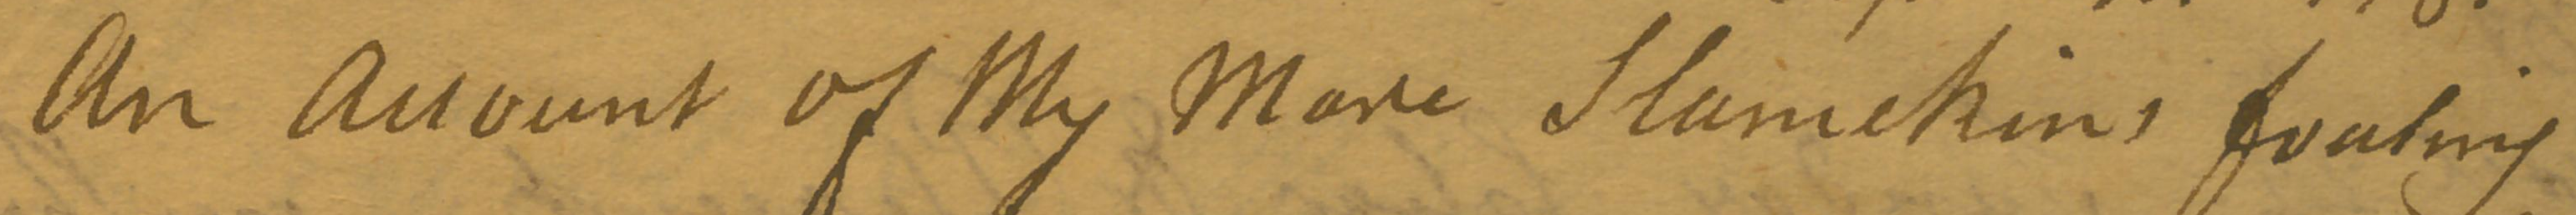An account of My Mare Slamekins foaling
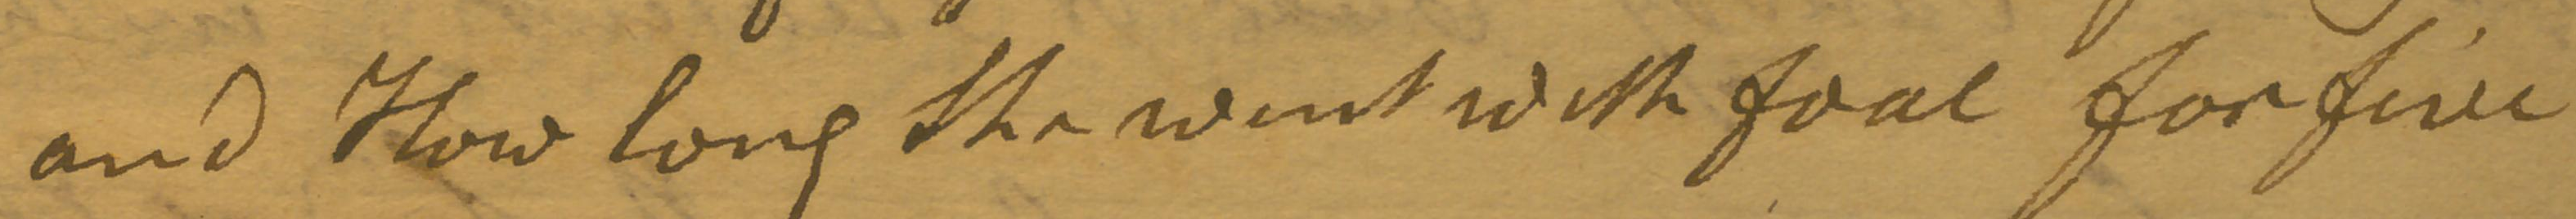and How long she went with foal for five
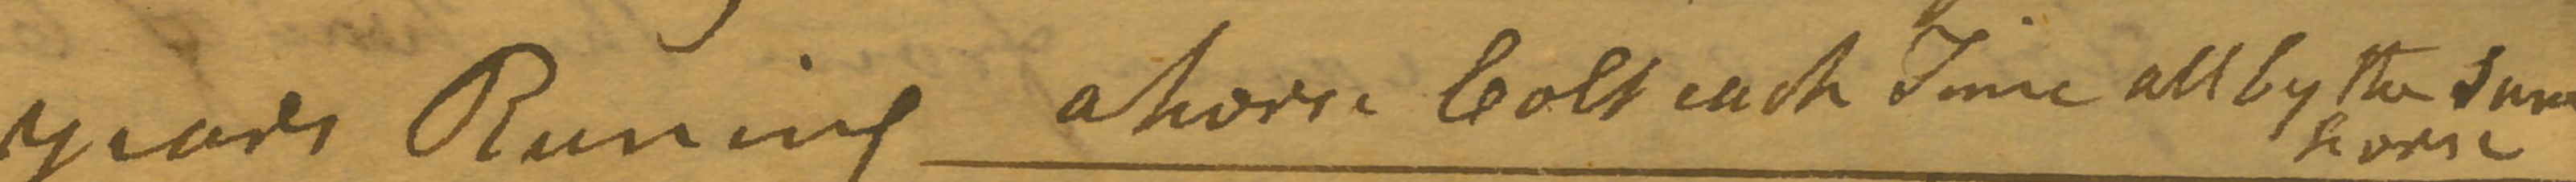years Runing a horse Colt each Time all by the Same
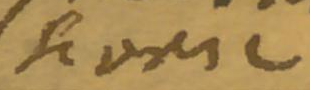horse
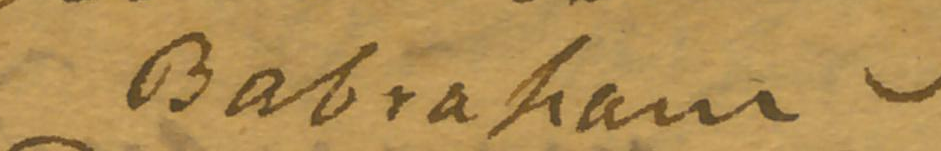Babraham
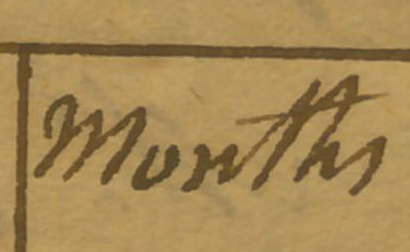Months
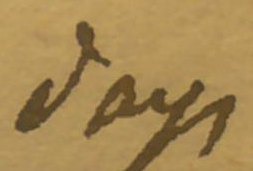days
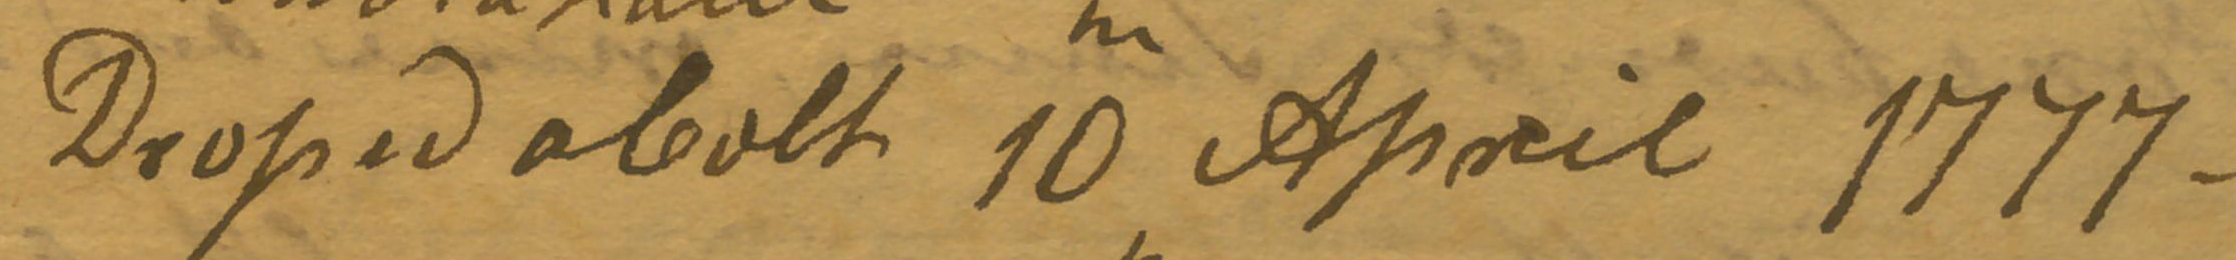Droped a Colt 10^th April 1777-
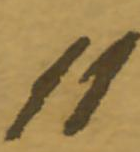11
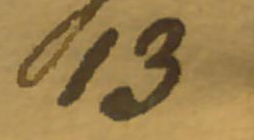13
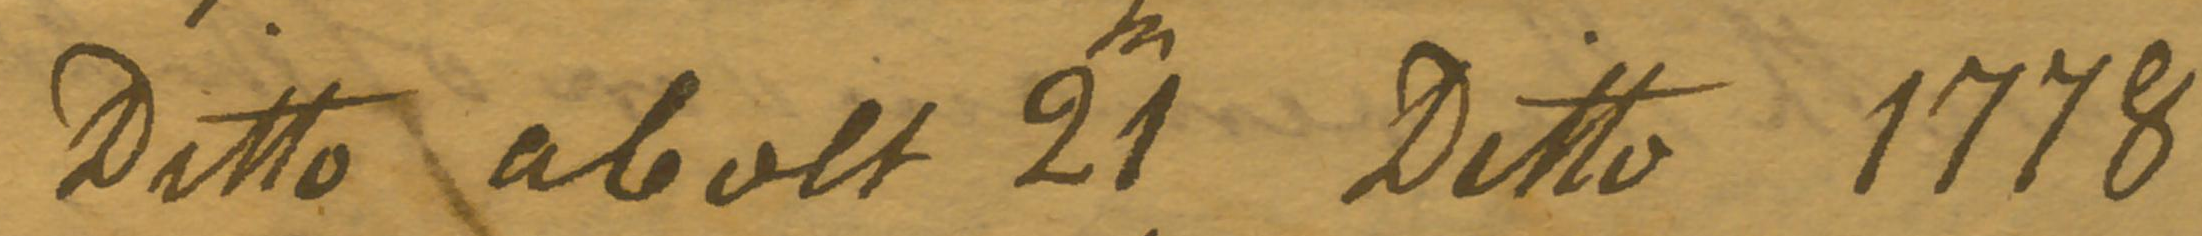Ditto a Colt 21^th Ditto 1778
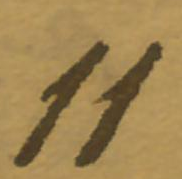11
